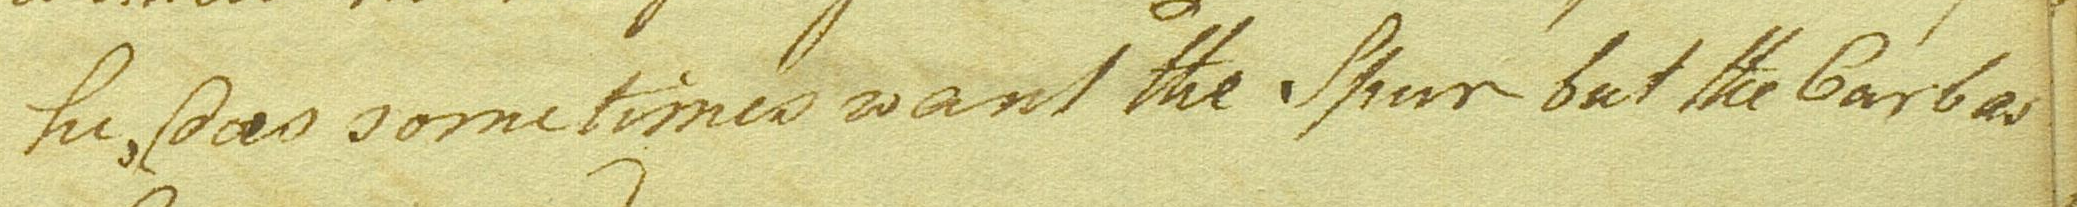he, does sometimes want the Spur but the Curb as
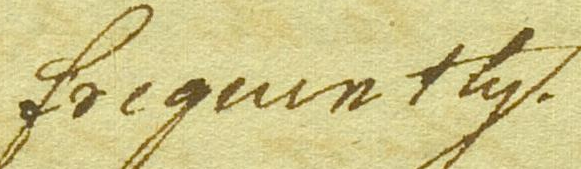frequently.
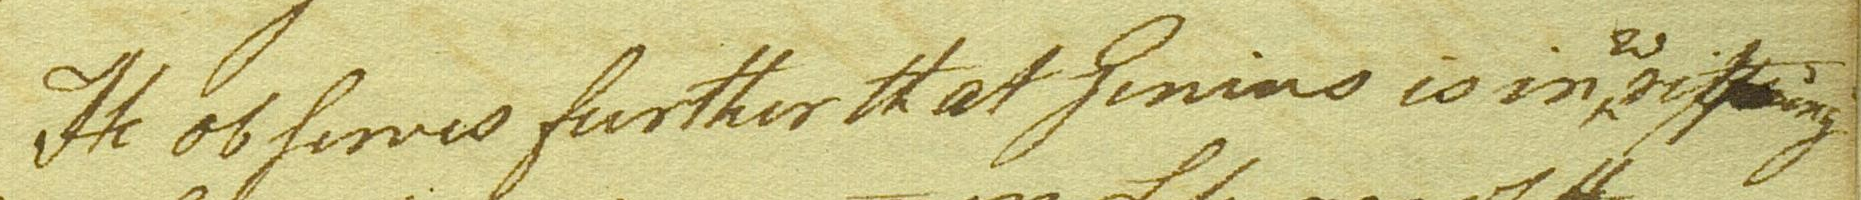He observes further that Genius is in ^writing
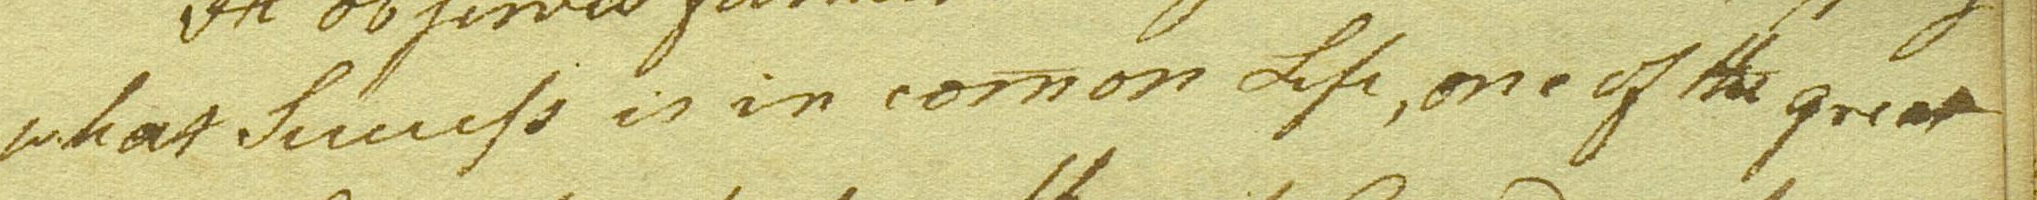what Success is in com̄on Life, one of the great
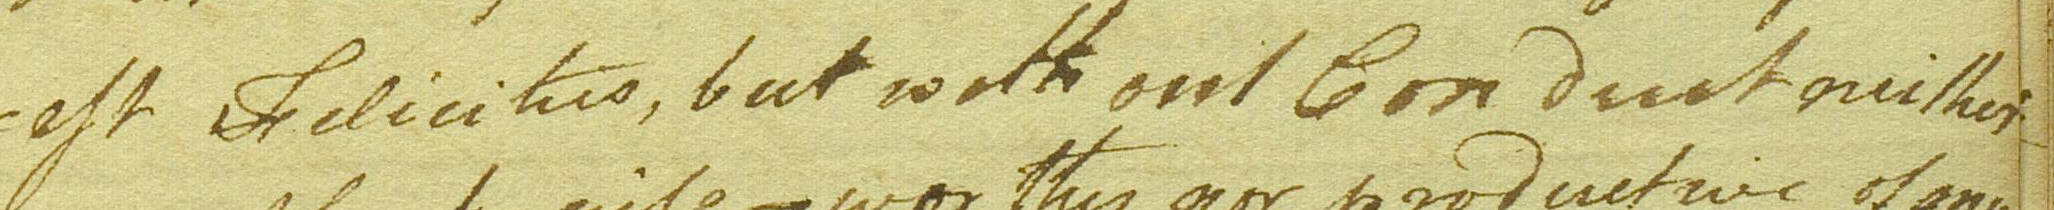-est Felicities, but without Conduct neither
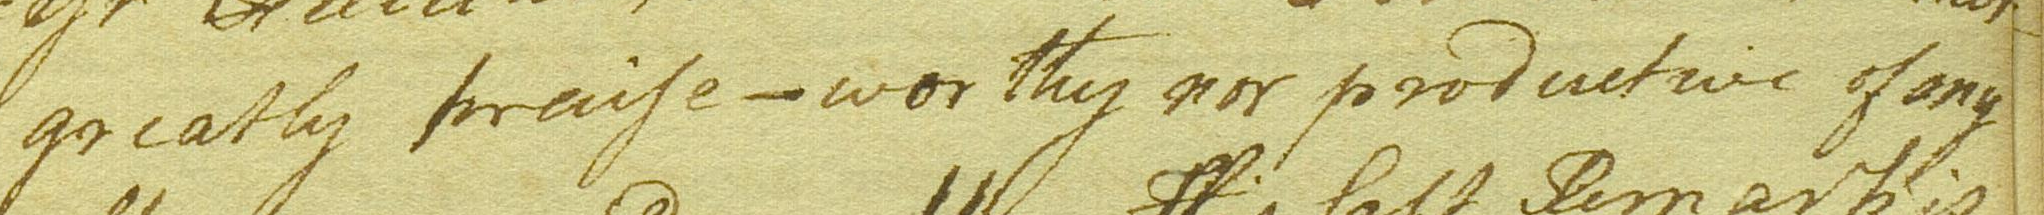greatly praise – worthy nor productive of any
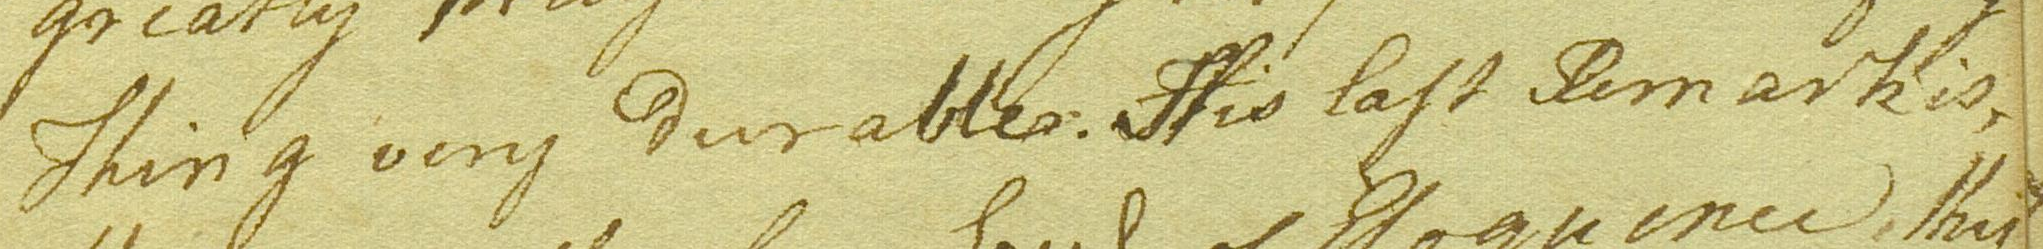Thing very durable. This last Remark is
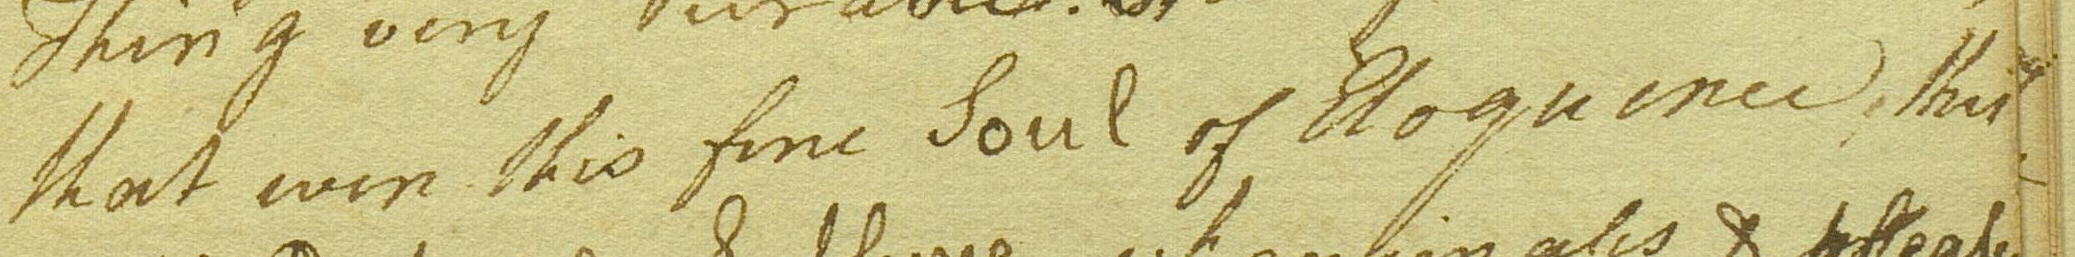that even this fine Soul of Eloquence, this
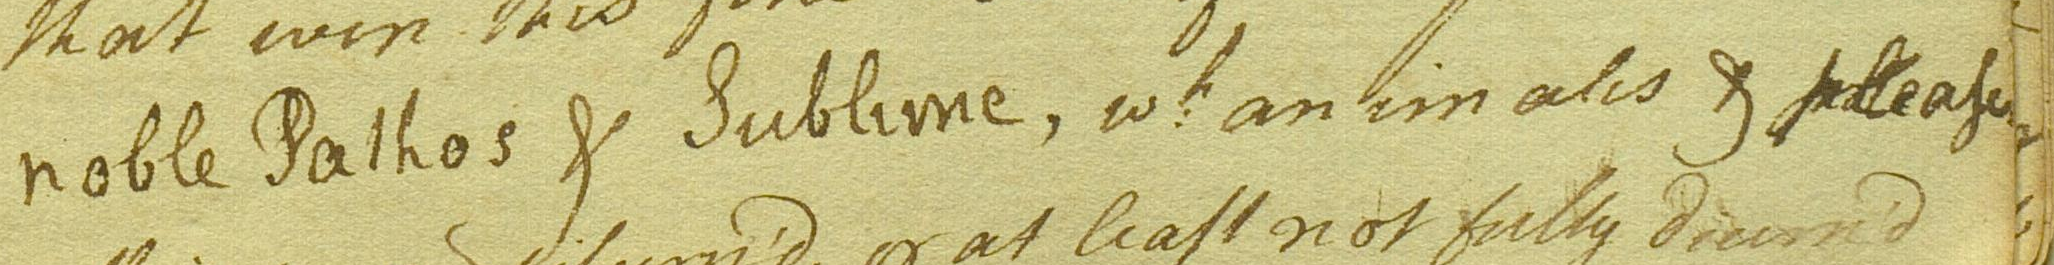noble Pathos & Sublime, w^h animates & pleases
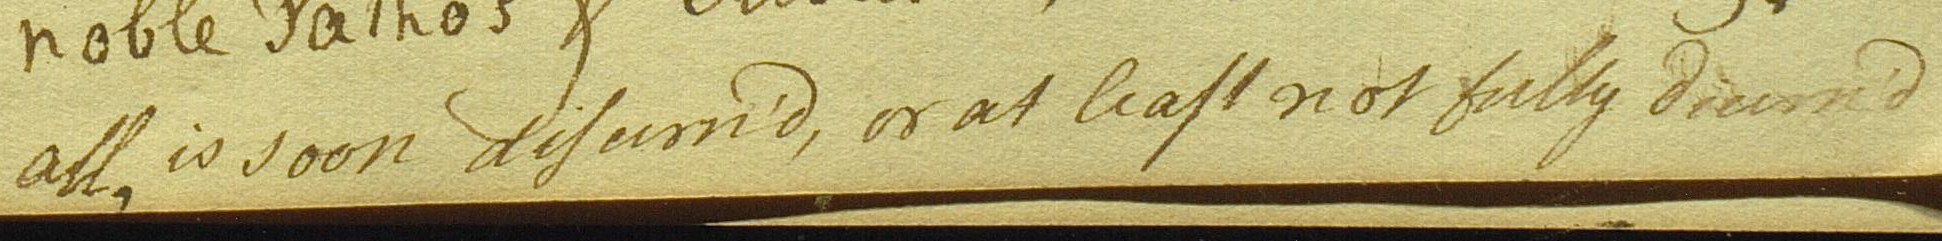all, is soon disurn'd, or at least not fully dream'd.
